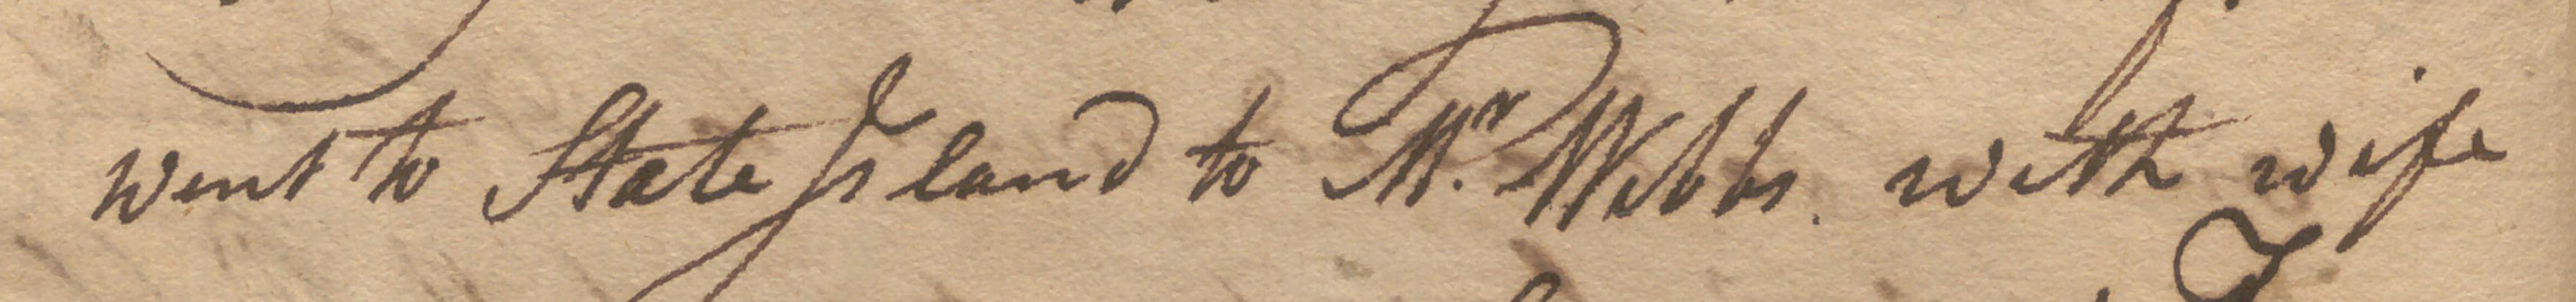went to State Island to M^r. Webbs with wife
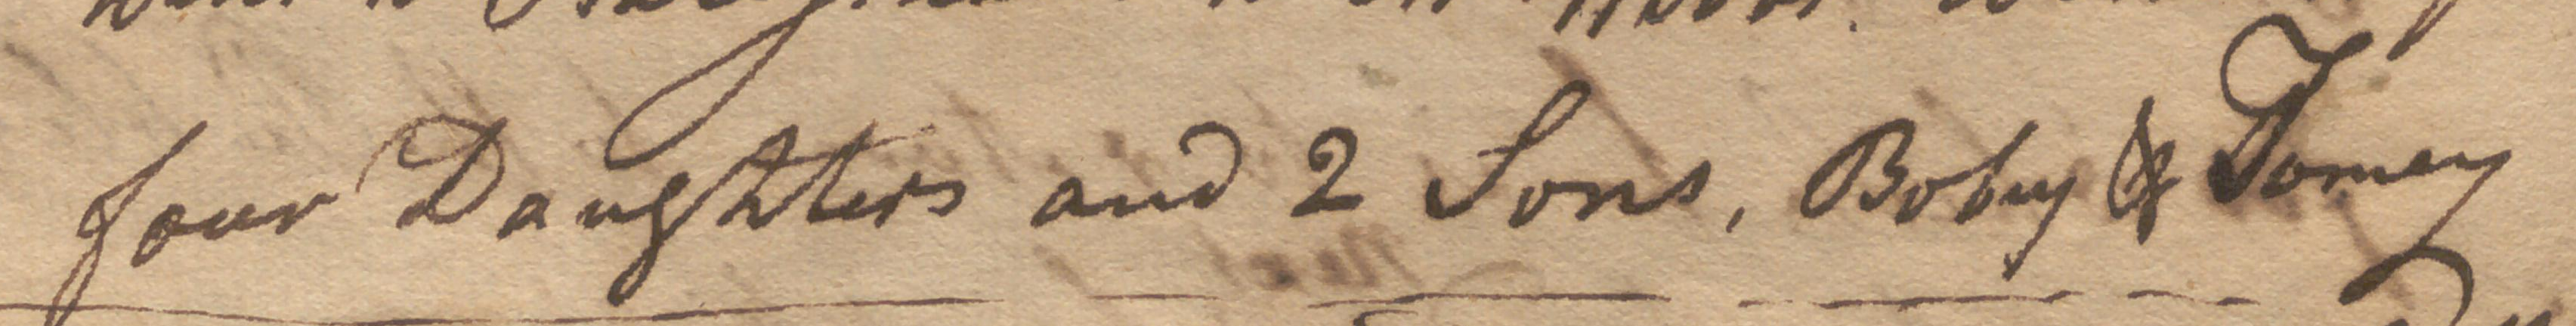four Daughters and 2 Sons, Bobey & Tomey
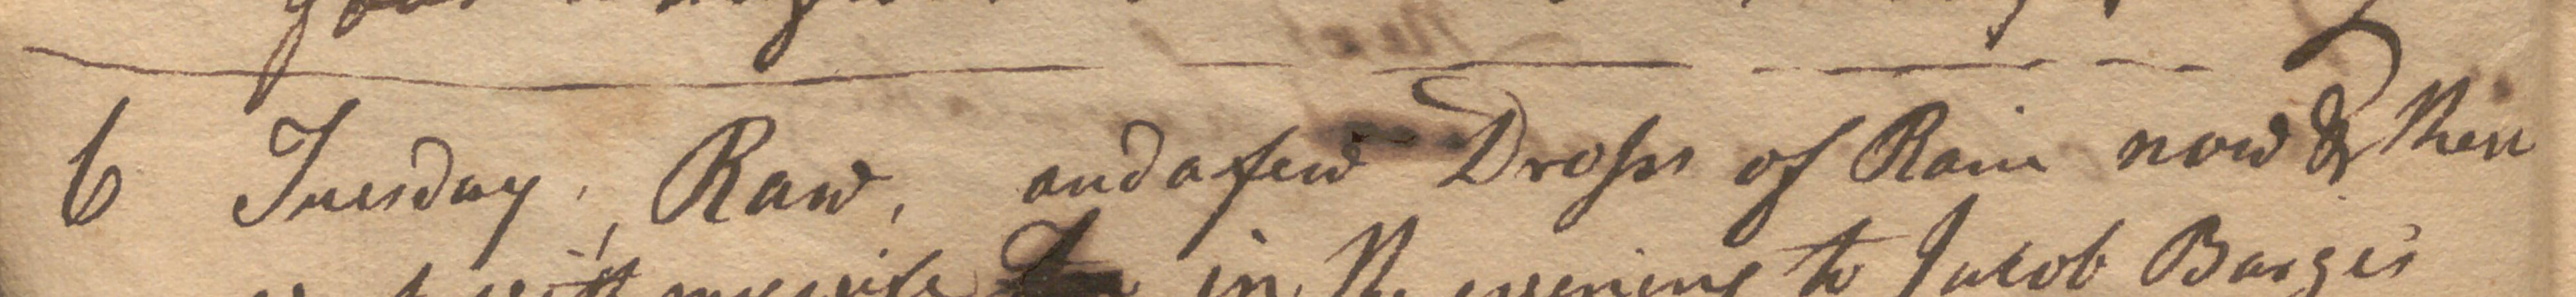6 Tuesday. Raw, and a few Dropes of Rain now & then
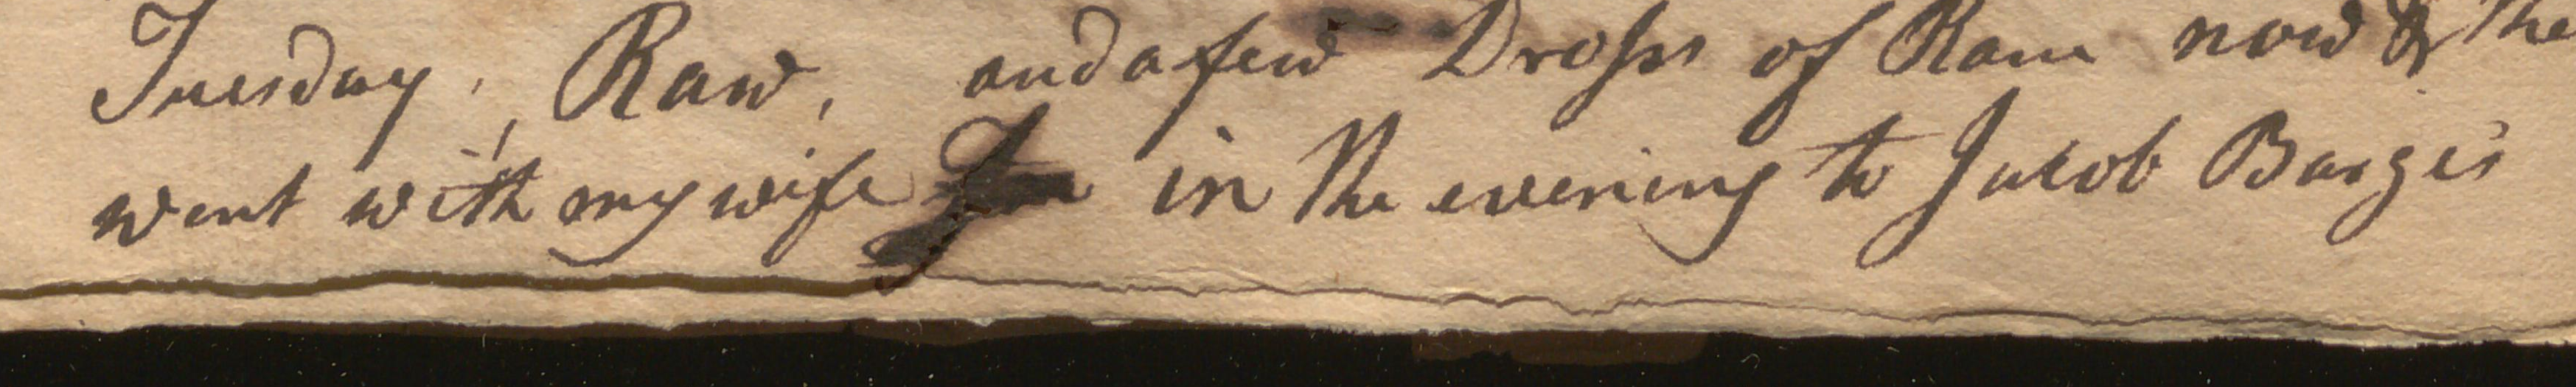went with my wife [__] in the evening to Jacob Barges
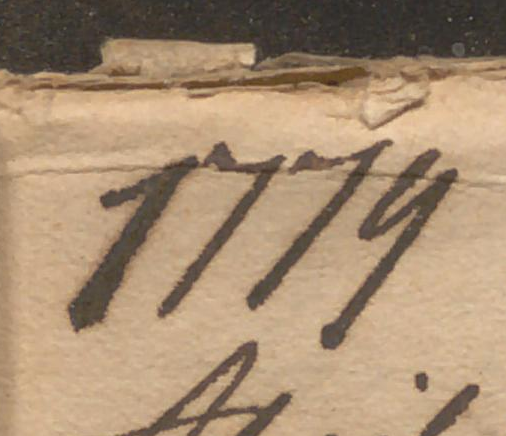1779
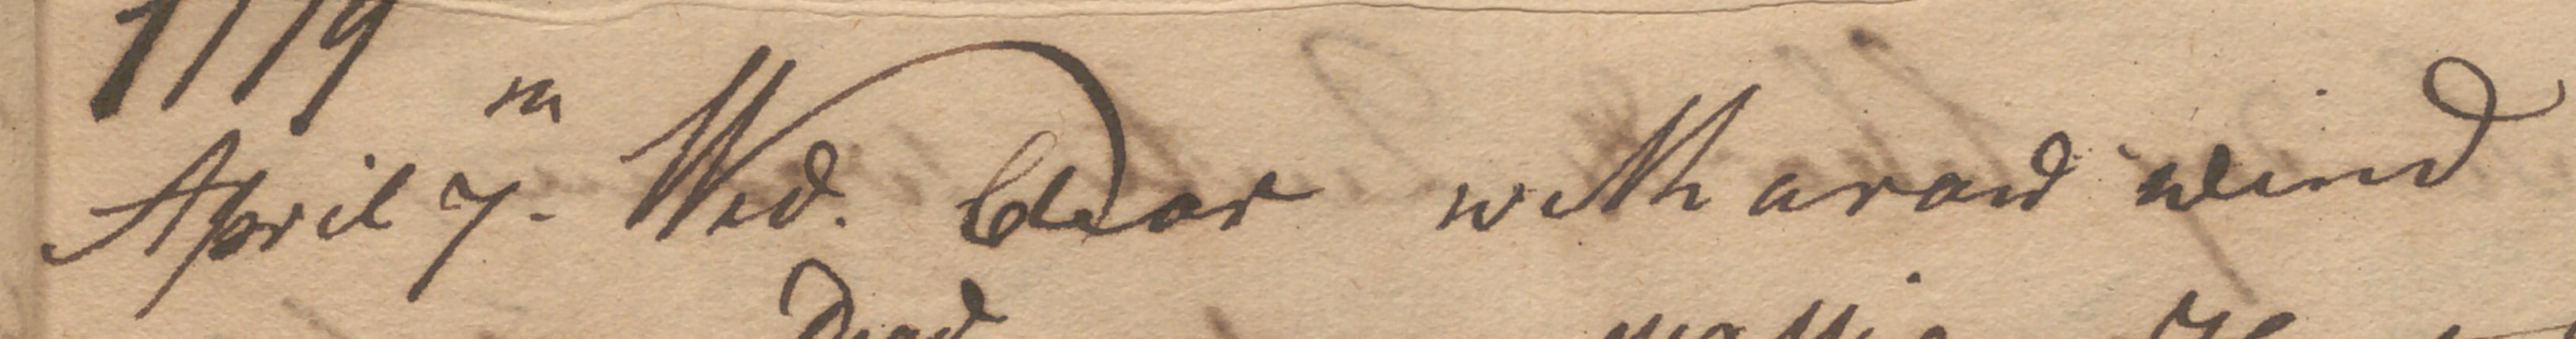April 7^th. Wed. clear with a raw wind
